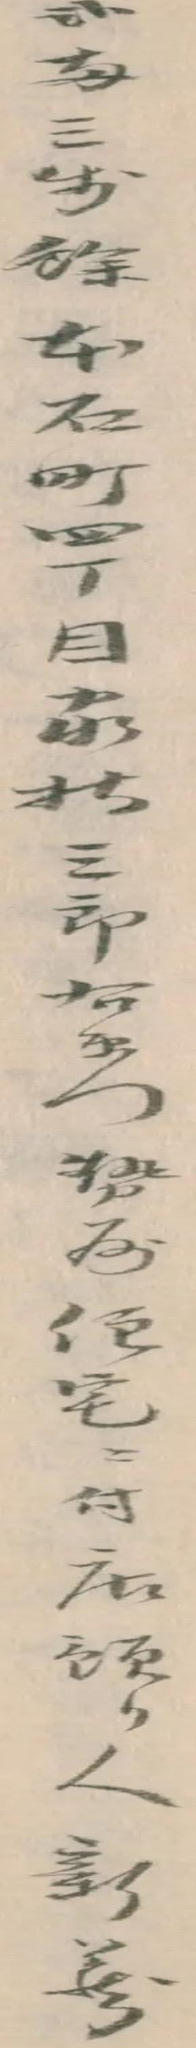二両三歩余本石町四丁目家持三郎右衛門勢州住宅付店預り人新蔵
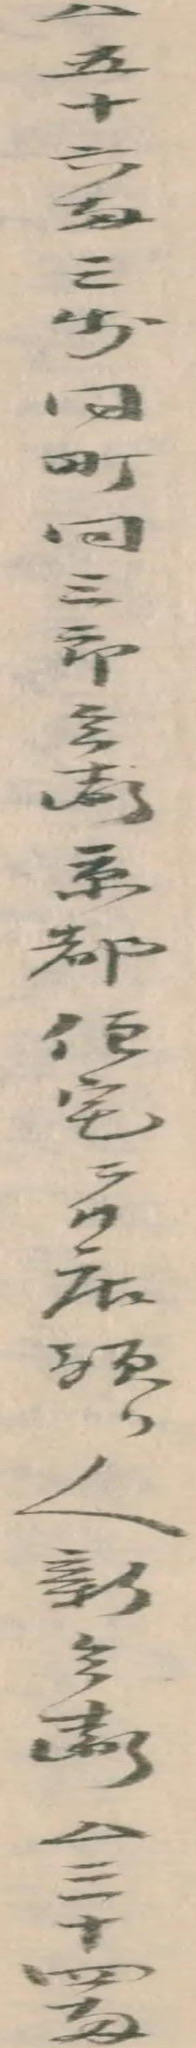△五十六両三歩同町同三郎兵衛京都住宅付店預り人新兵衛△三十四両
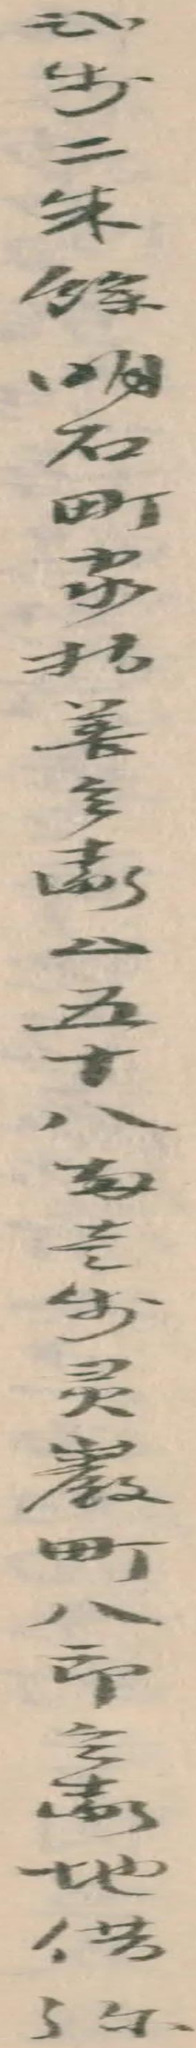弐歩二朱余明石町家持善兵衛△五十八両壱歩霊巖町八郎兵衛地借弥
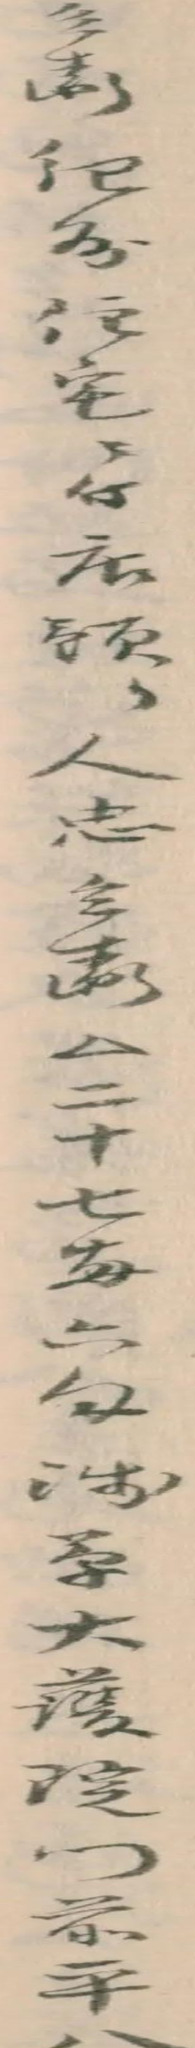兵衛紀州住宅付店預り人忠兵衛△二十七両六匁浅草大護院門前平八
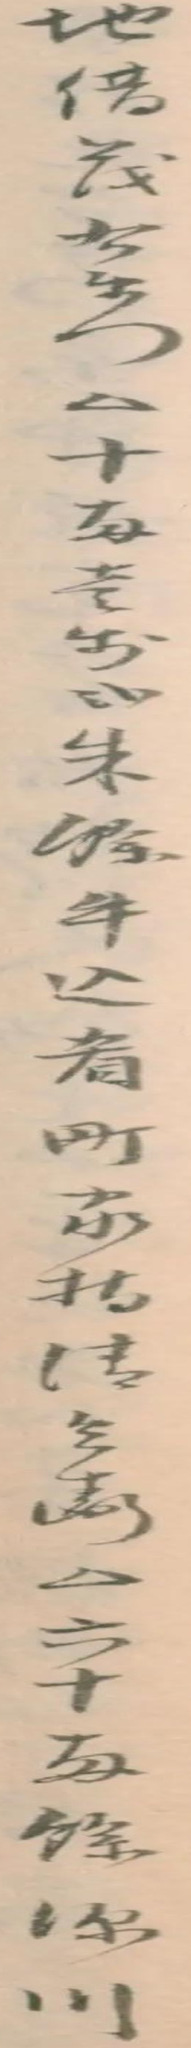地借茂右衛門△十両壱歩弐朱余牛込肴町家持清兵衛△六十両余深川
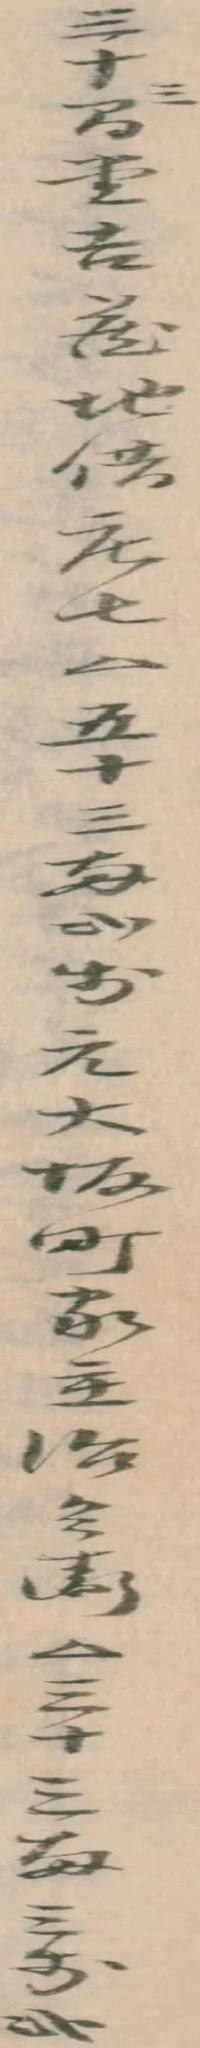三十三間堂吉蔵地借庄七△五十三両弐歩元大坂町家主治兵衛△三十三両三歩弐
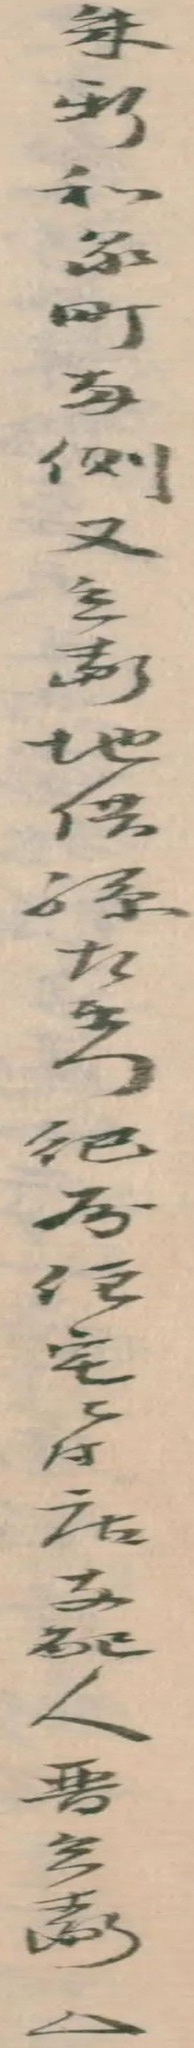朱新和泉町両側又兵衛地借孫左衛門紀州住宅付店支配人晋兵衛△
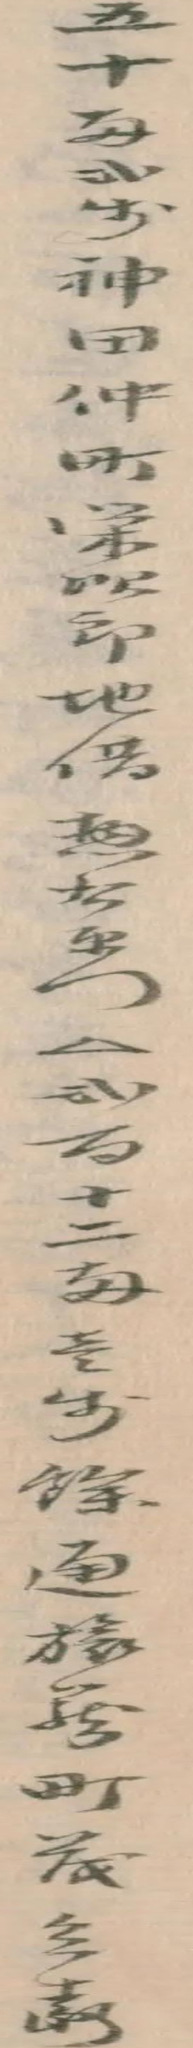五十両弐歩神田仲町栄次郎地借惣右衛門△弐百十二両壱歩余通旅籠町茂兵衛
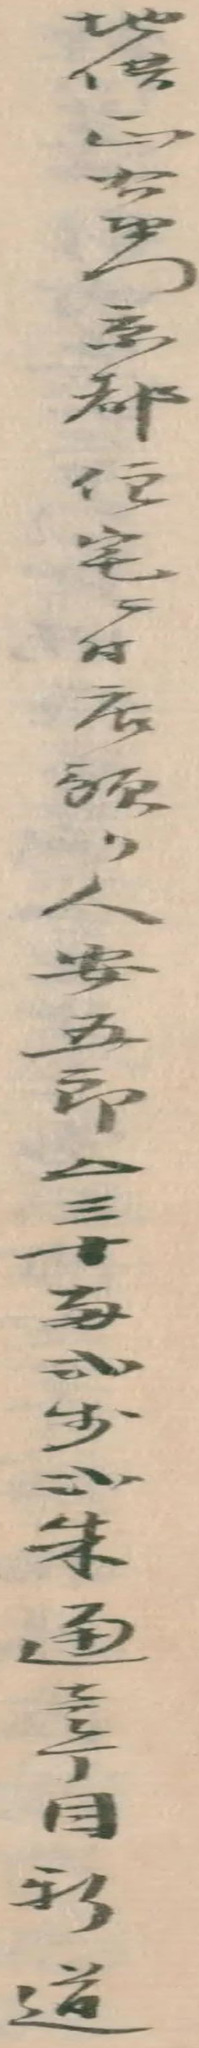地借正右衛門京都住宅付店預り人安五郎△三十両弐歩弐朱通壱丁目新道
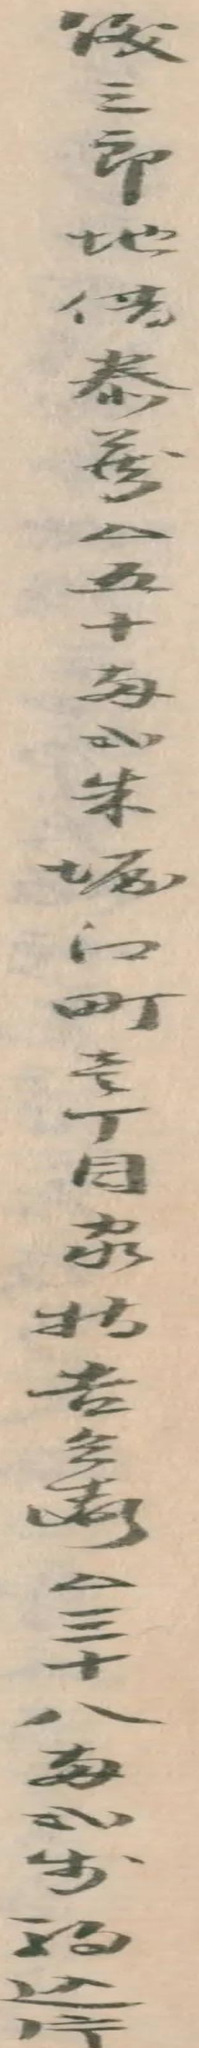儀三郎地借泰蔵△五十両弐朱堀江町壱丁目家持吉兵衛△三十八両弐歩駒込片
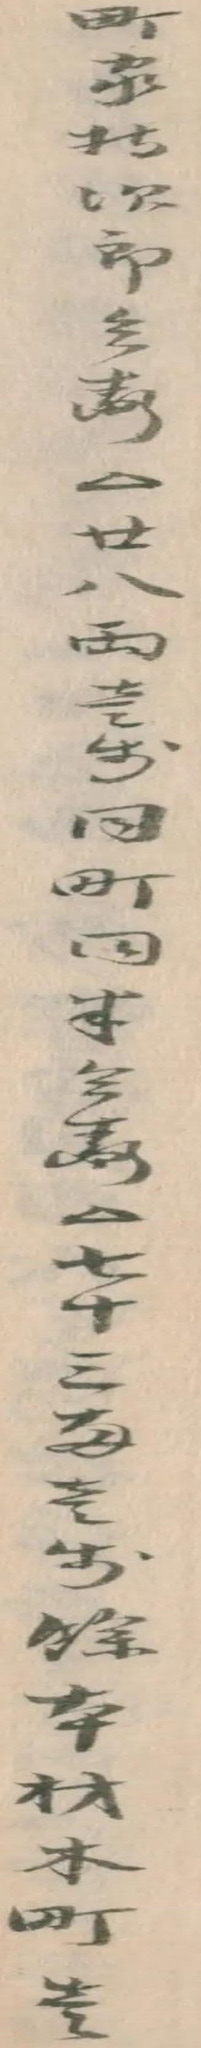町家持次郎兵衛△廿八両壱歩同町同半兵衛△七十三両壱歩余本材木町壱
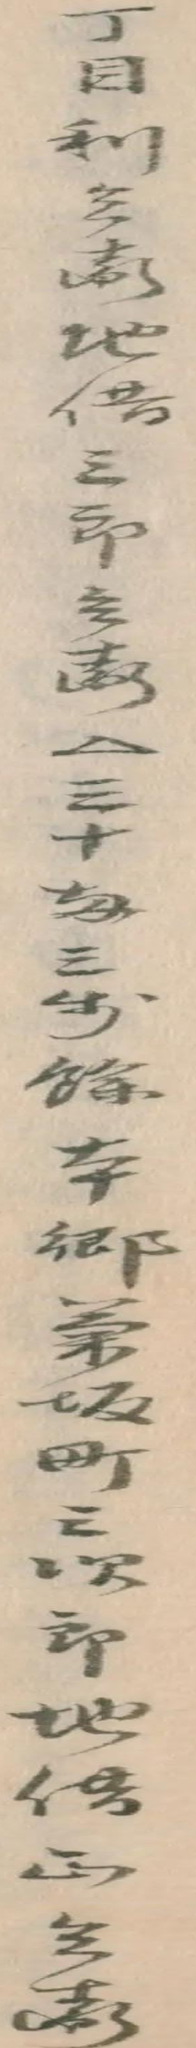丁目利兵衛地借三郎兵衛△三十両三歩余本郷菊坂町三次郎地借正兵衛
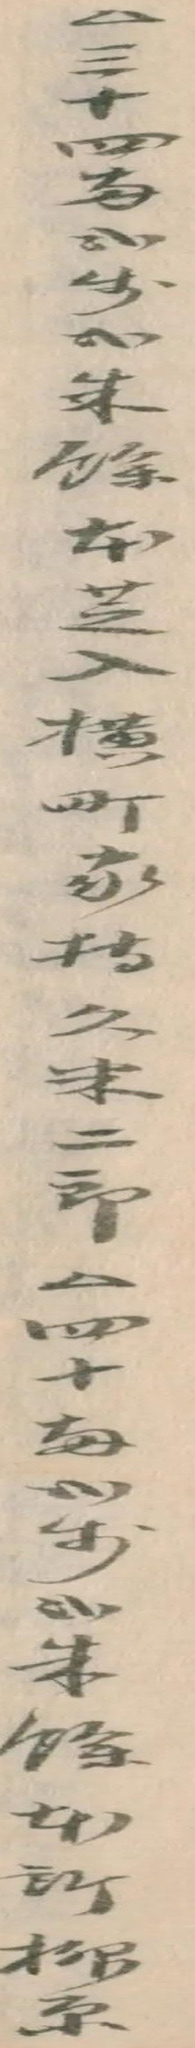△三十四両弐歩弐朱余本芝入横町家持久米二郎△四十両弐歩弐朱余本所柳原
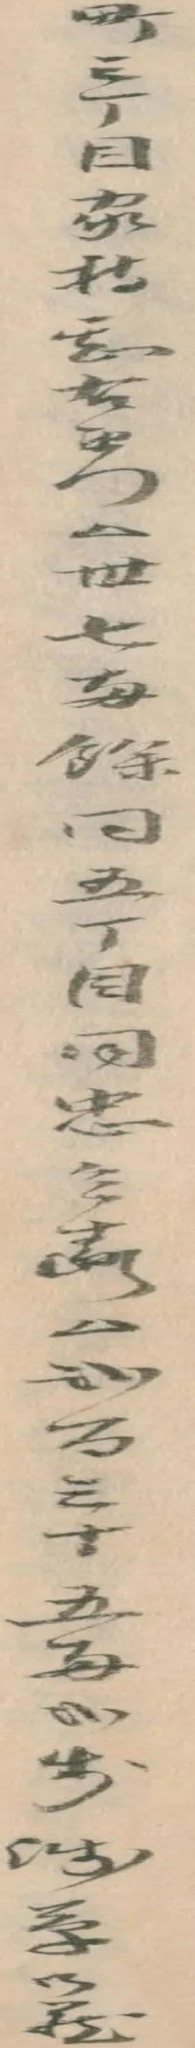町三丁目家持甚右衛門△丗七両余同五丁目同忠兵衛△弐百三十五両弐歩浅草御蔵

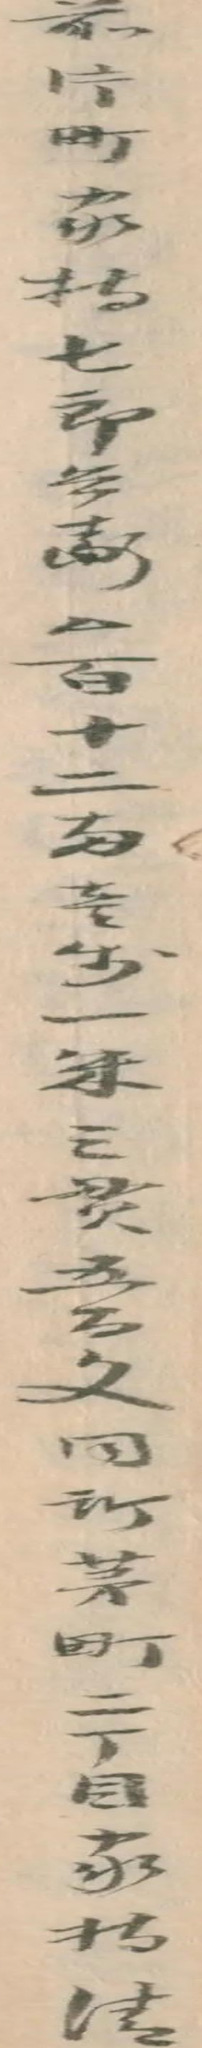前片町家持七郎兵衛△百十二両壱歩一朱三貫五百文同所茅町二丁目家持清
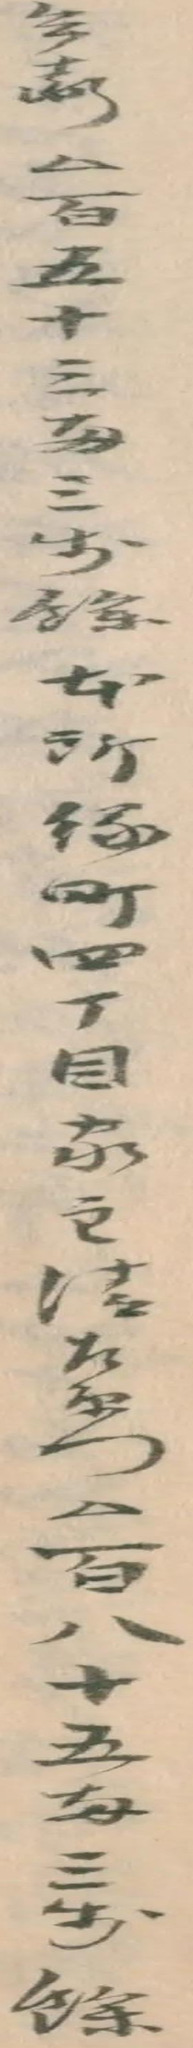兵衛△百五十三両三歩余本所緑町四丁目家主清左衛門△百八十五両三歩余
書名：地災撮要. 巻10(地震之部) 上,下
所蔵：国立国会図書館 National Diet Library, JAPAN
